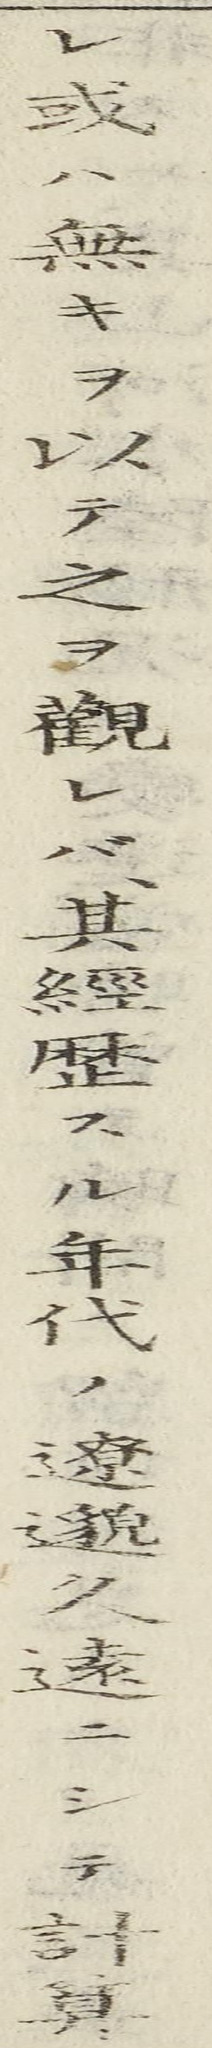レ或ハ無キヲ以テ之ヲ観レバ、其経歴スル年代ノ遼邈久遠ニシテ計算
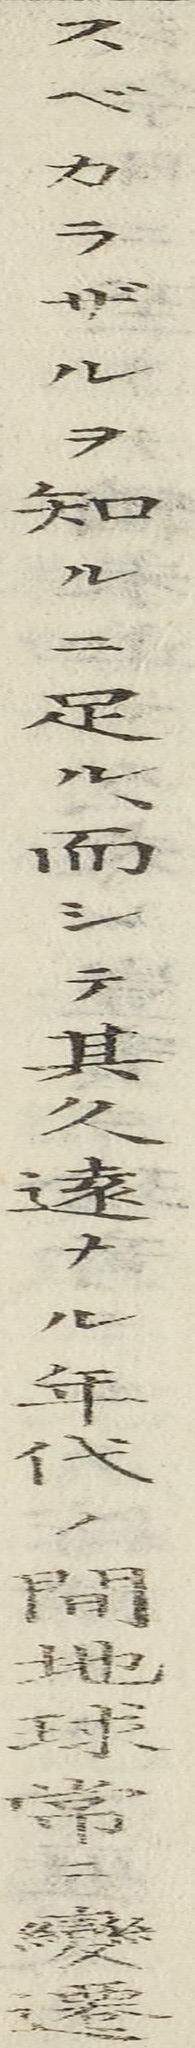スベカラザルヲ知ルニ足ル、而シテ其久遠ナル年代ノ間地球常ニ変遷

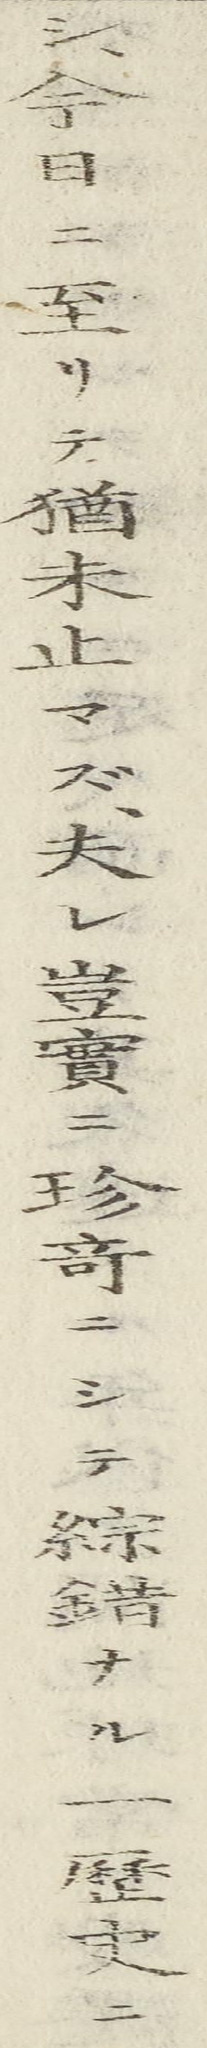シ、今日ニ至リテ猶未止マズ、夫レ豈実ニ珍奇ニシテ綜錯ナル一歴史ニ
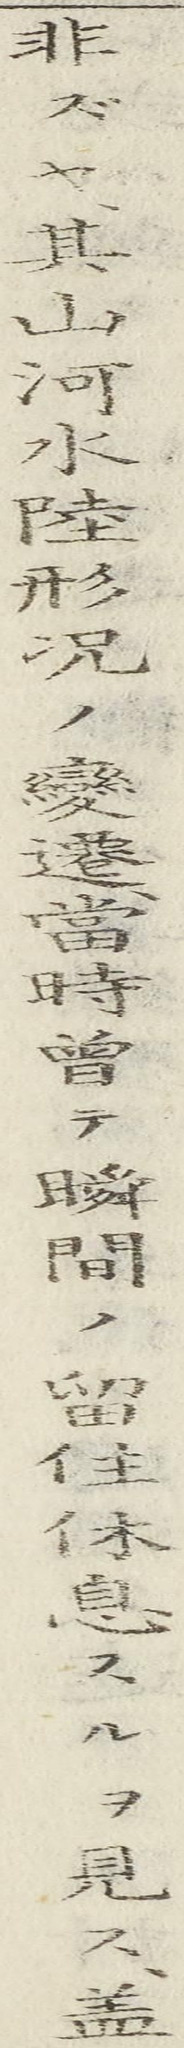非ズヤ、其山河水陸形況ノ変遷、当時曾テ瞬間ノ留往休息スルヲ見ス、盖
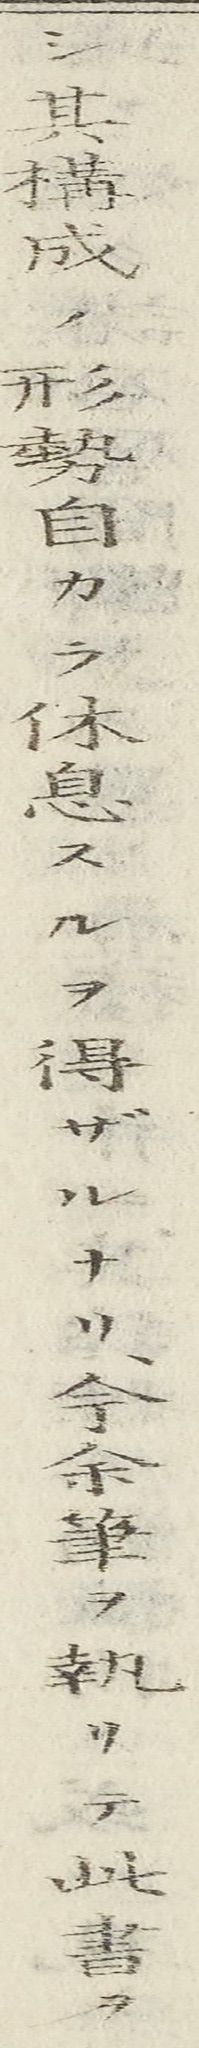シ其構成ノ形勢自カラ休息スルヲ得ザルナリ、今余筆ヲ執リテ此書ヲ
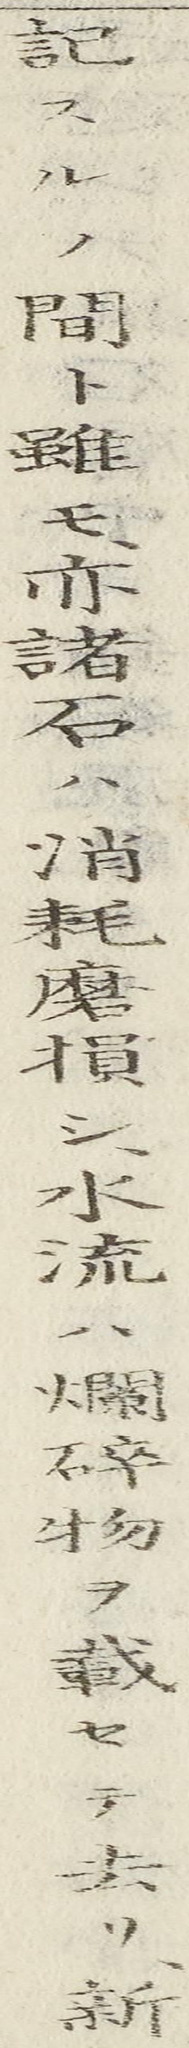記スルノ間ト雖モ、亦諸石ハ消耗磨損シ、水流ハ爛砕物ヲ載セテ去リ、新
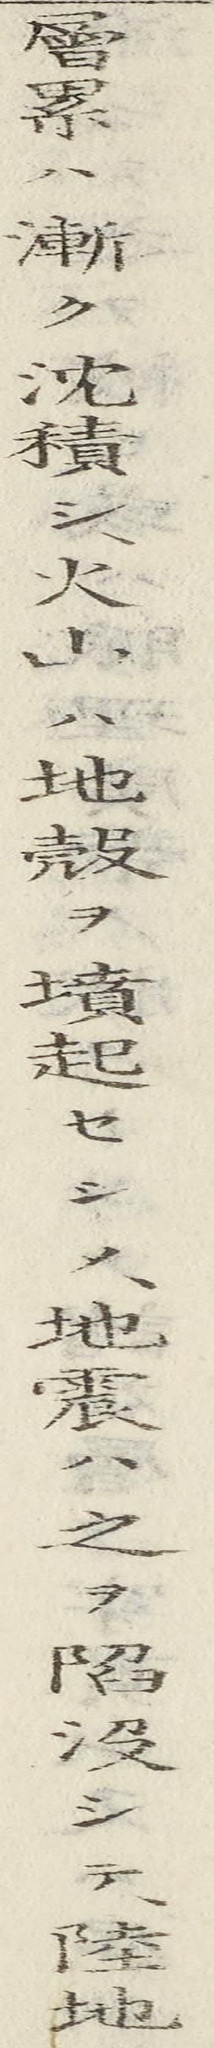層累ハ漸ク沈積シ、火山ハ地殻ヲ墳起セシメ、地震ハ之ヲ陥没シテ、陸地
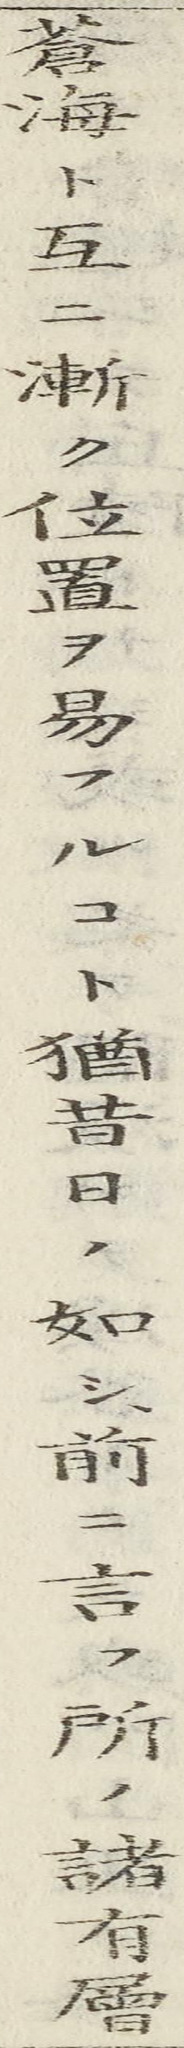蒼海ト互ニ漸ク位置ヲ易フルコト猶昔日ノ如シ、前ニ言フ所ノ諸有層
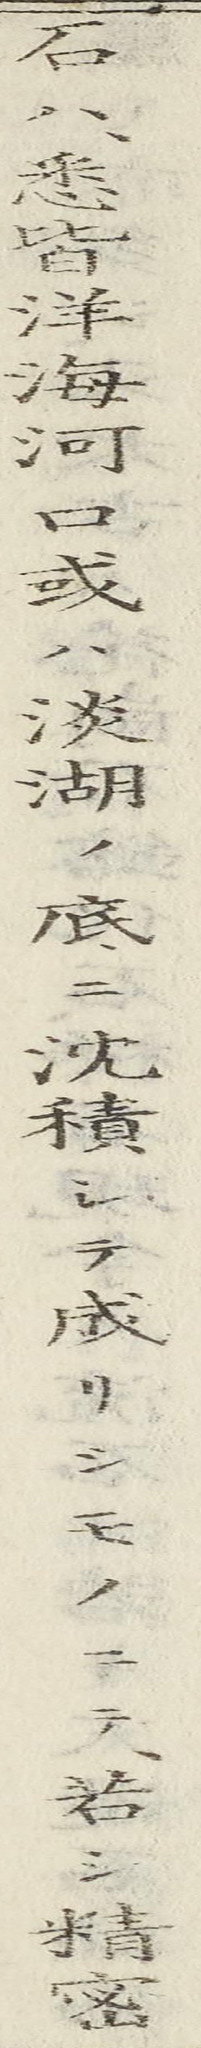石ハ、悉皆洋海河口或ハ淡湖ノ底ニ沈積シテ成リシモノニテ、若シ精密
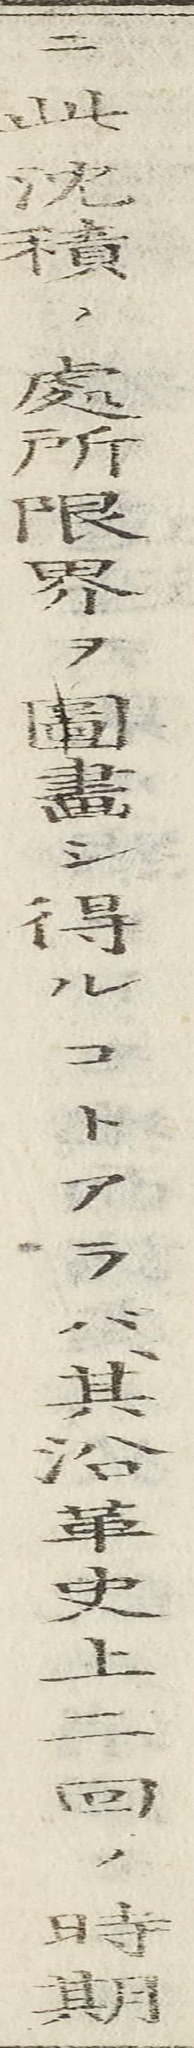ニ此沈積ノ処所限界ヲ図画シ得ルコトアラバ、其沿革史上二回ノ時期
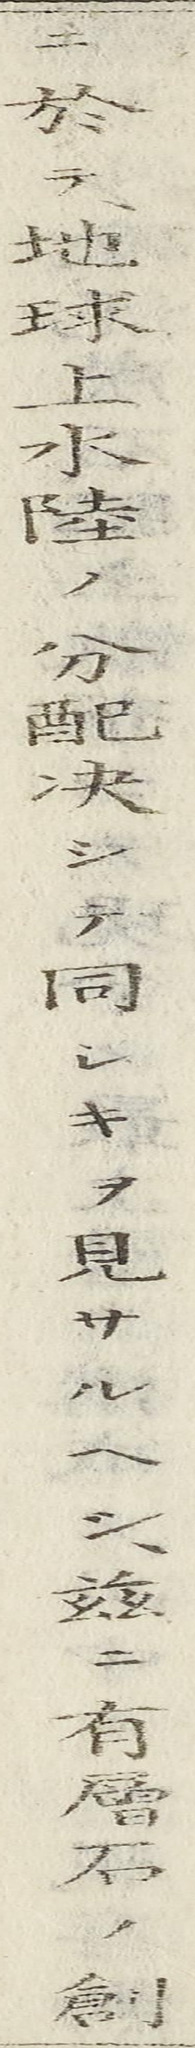ニ於テ、地球上水陸ノ分配決シテ同シキヲ見サルヘシ、爰ニ有層石ノ創
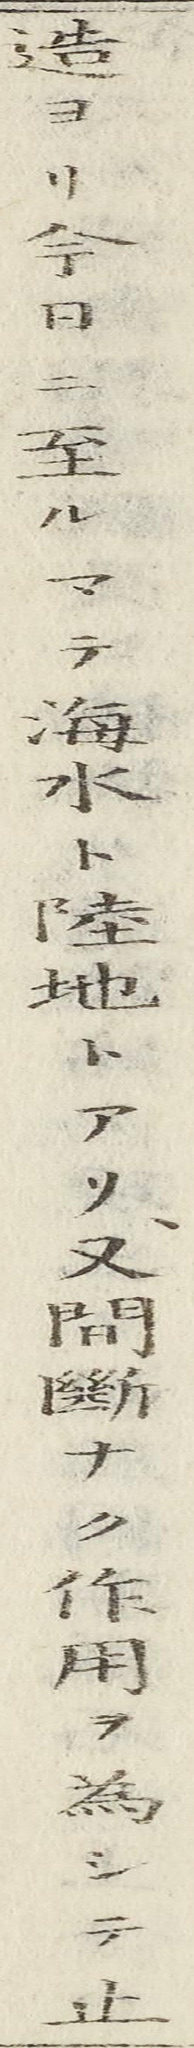造ヨリ今日ニ至ルマテ海水ト陸地トアリ、又間断ナク作用ヲ為シテ止
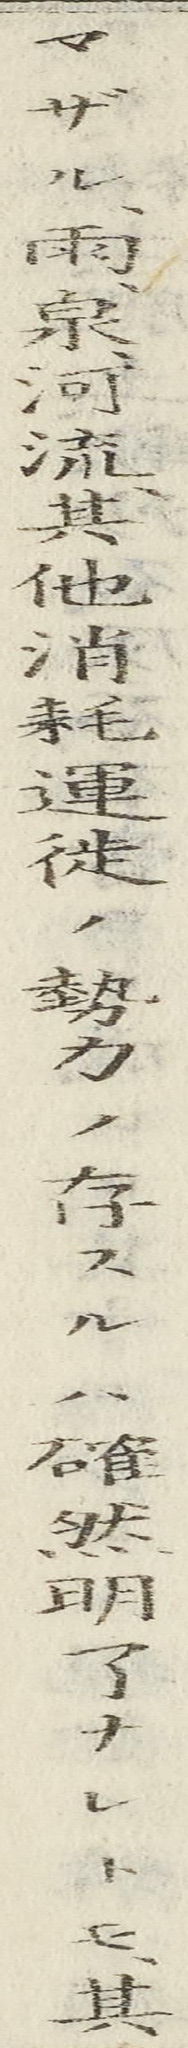マザル、雨、泉、河流、其他消耗運徒ノ勢力ノ存スルハ確然明了ナレトモ、其
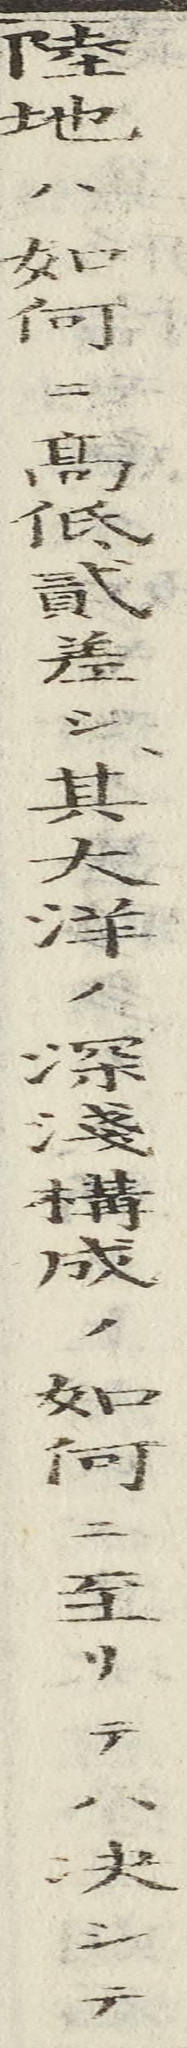陸地ハ如何ニ高低弐差シ、其大洋ノ深浅構成ノ如何ニ至リテハ決シテ
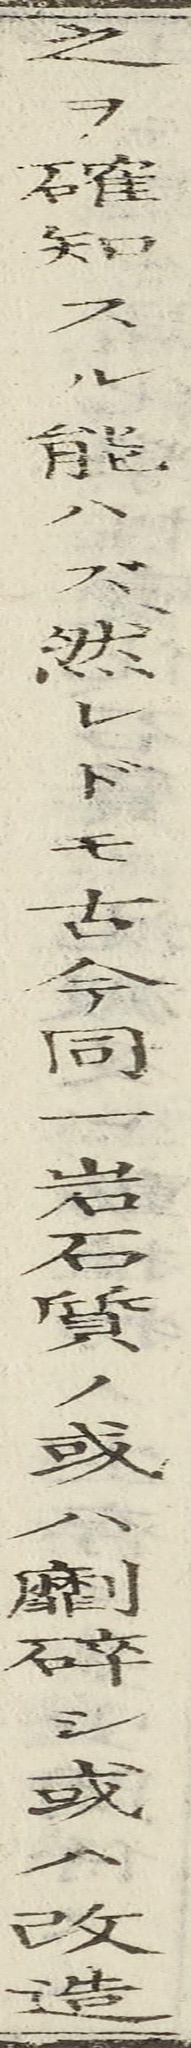之ヲ確知スル能ハズ、然レドモ古今同一岩石質ノ或ハ劘砕シ或ハ改造
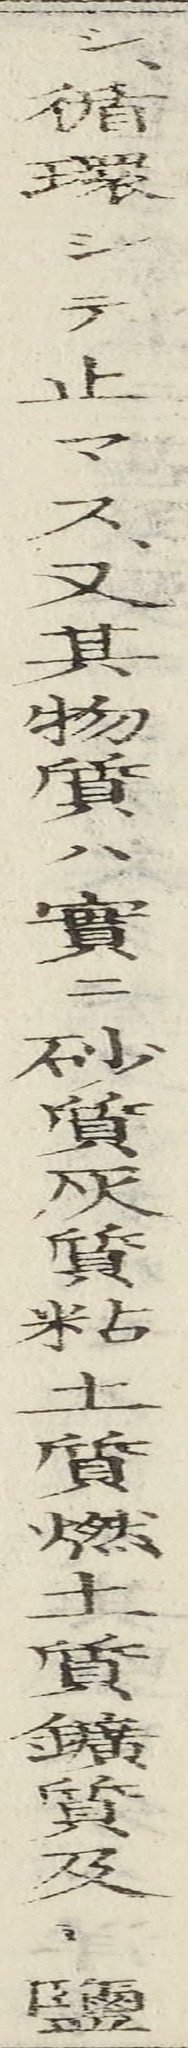シ、循環シテ止マス、又其物質ハ実ニ砂質灰質粘土質燃土質鉱質及ヒ塩
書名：百科全書　地文學　全
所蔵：東京大学地震研究所図書室 Earthquake Research Institute Library, The University of Tokyo, JAPAN
